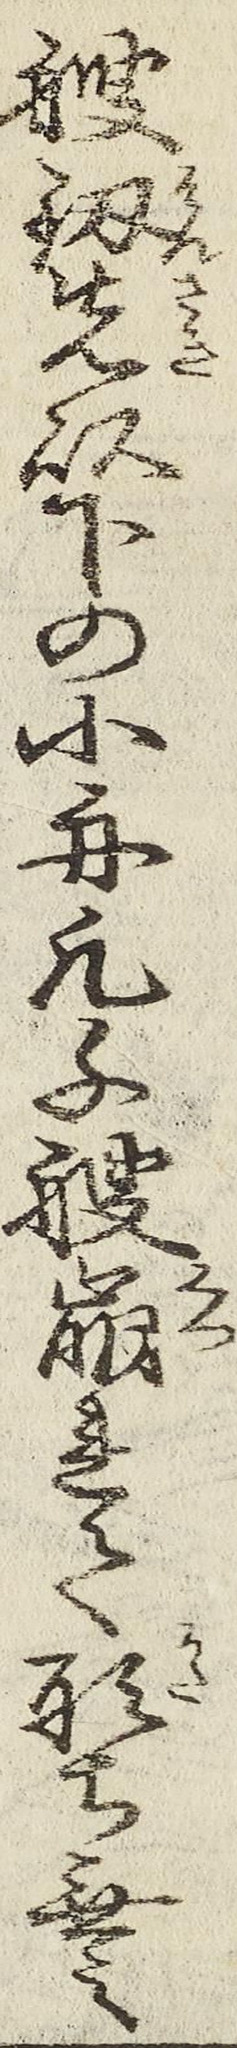艘剣先以下の小舟凡千艘崩れて形ち無之
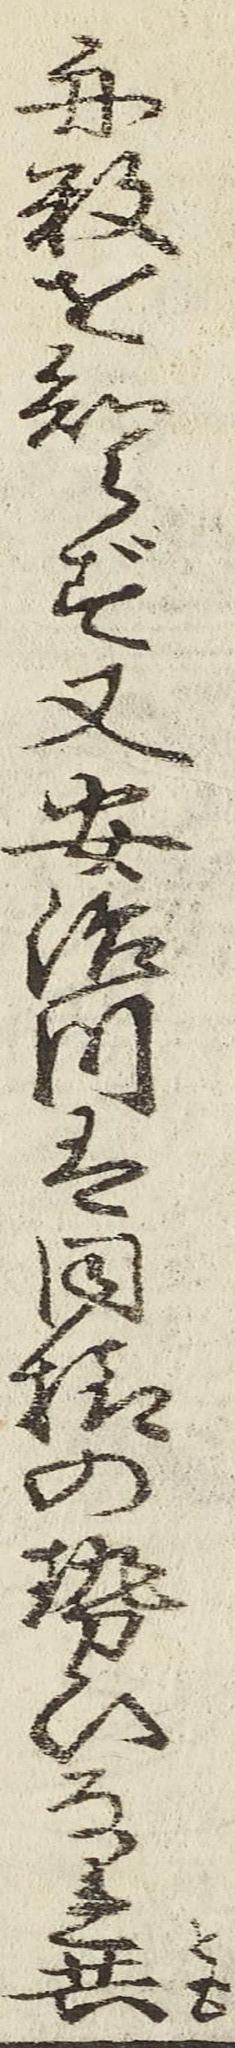舟数を知らず又安治川は同様の勢ひなれ共
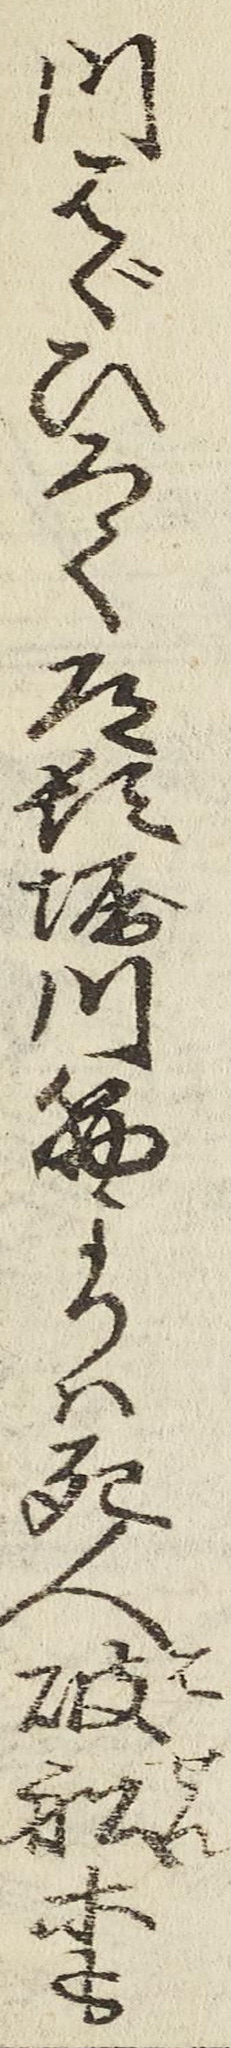川はゞひろく道頓堀川筋よりは死人破船等も
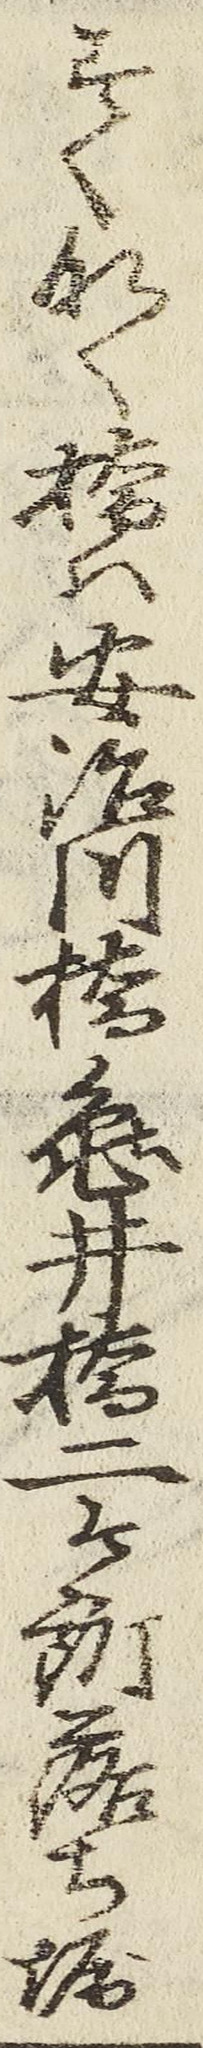すくなく橋は安治川橋亀井橋ニケ所落ち堀
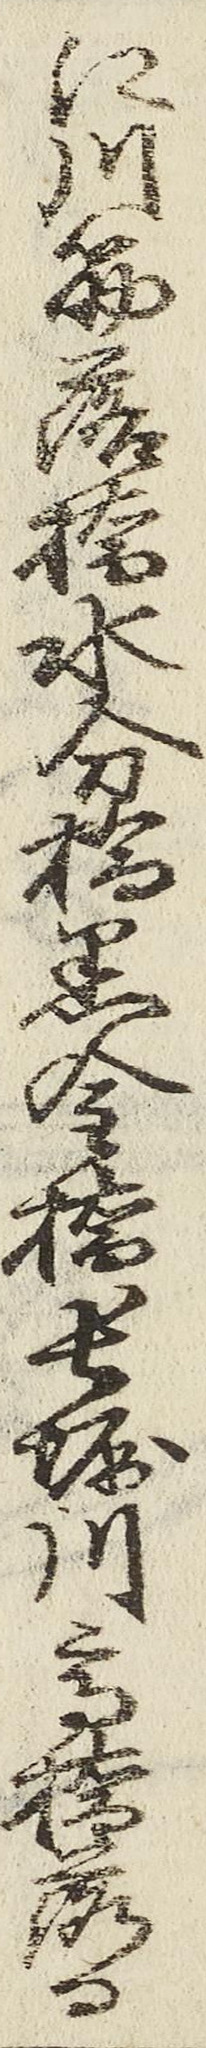江川筋落橋水分橋黒金橋長堀川高橋落る
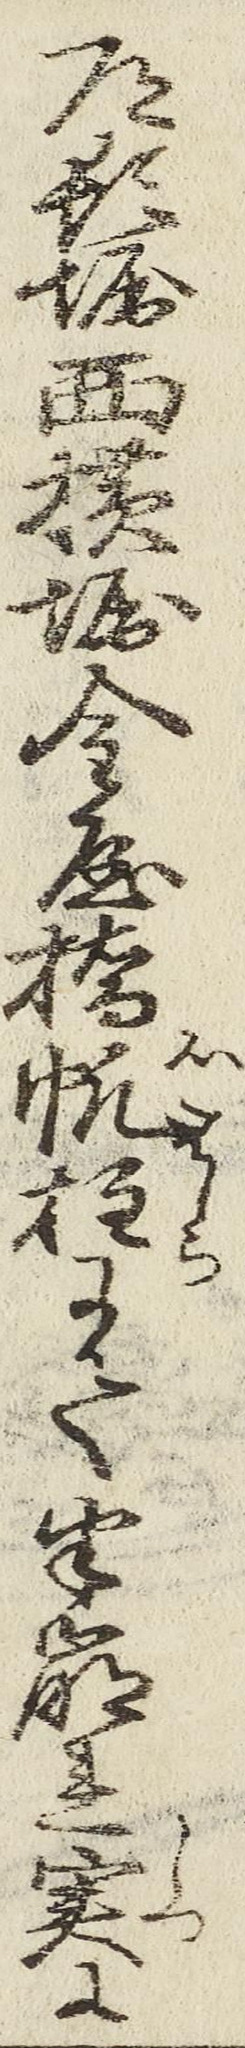道頓堀西横堀金屋橋帆柱にて半崩れ実に
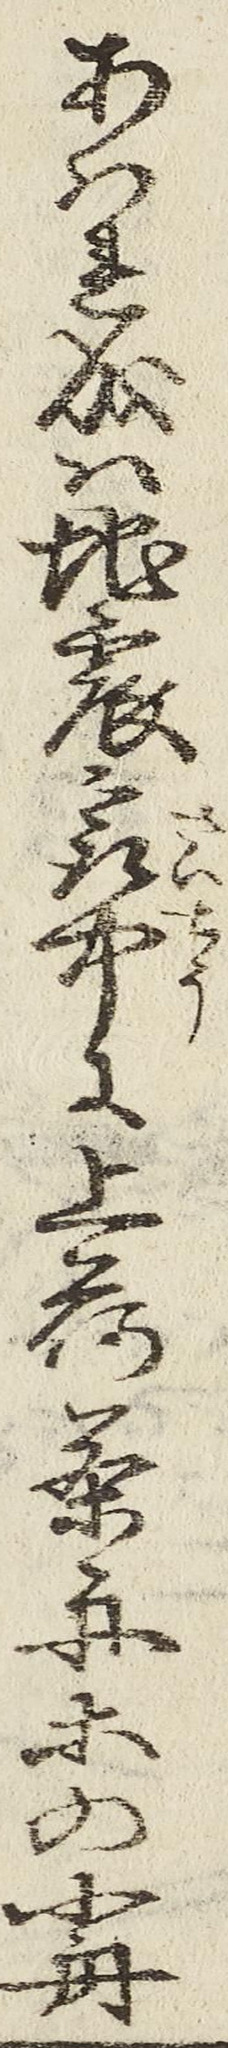あはれ成は地震最中に上荷茶舟等の小舟
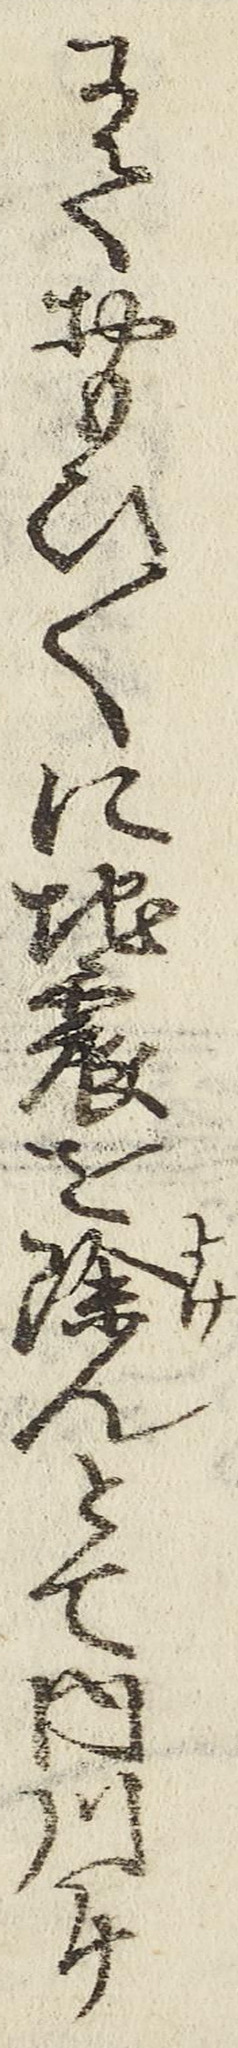にておもひ〳〵に地震を除んとて内川に
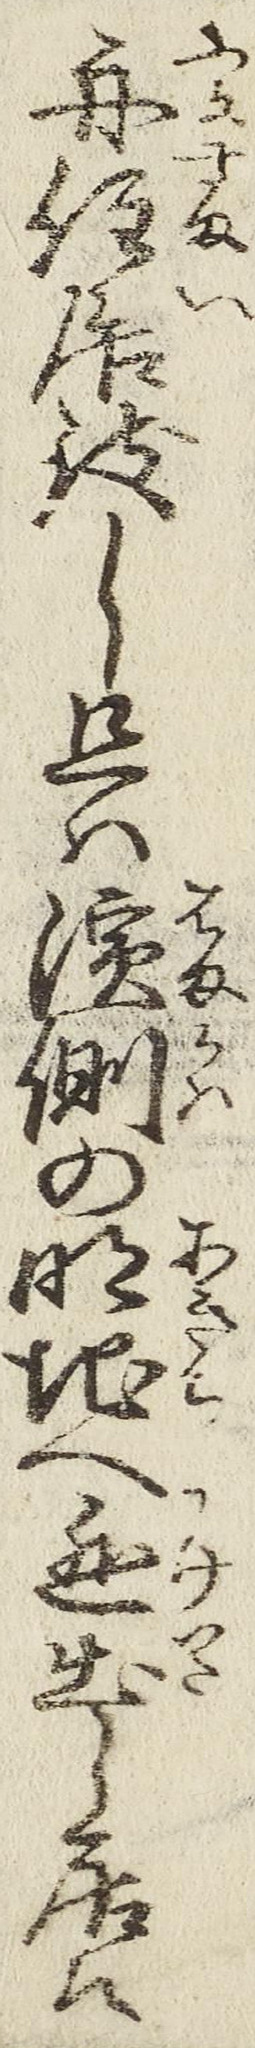舟住居致し且は浜側の明地へ逃出し居候
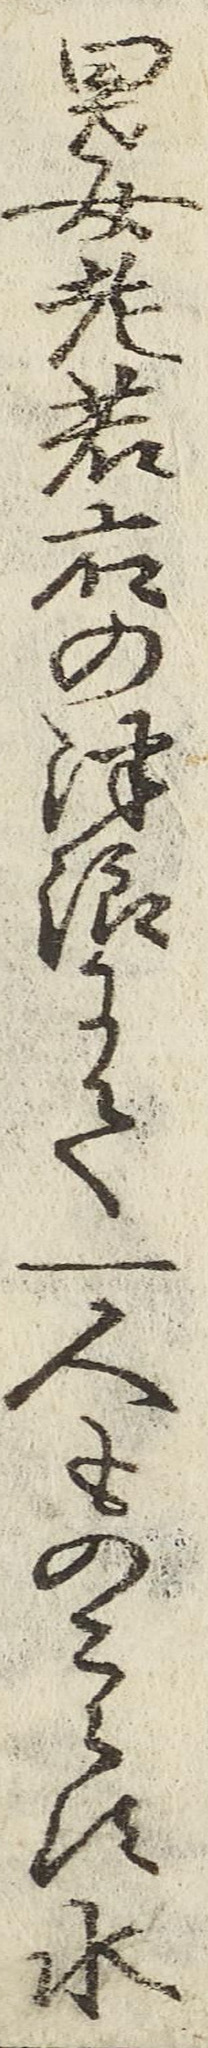男女老若右の津浪にて一人ものこらす水
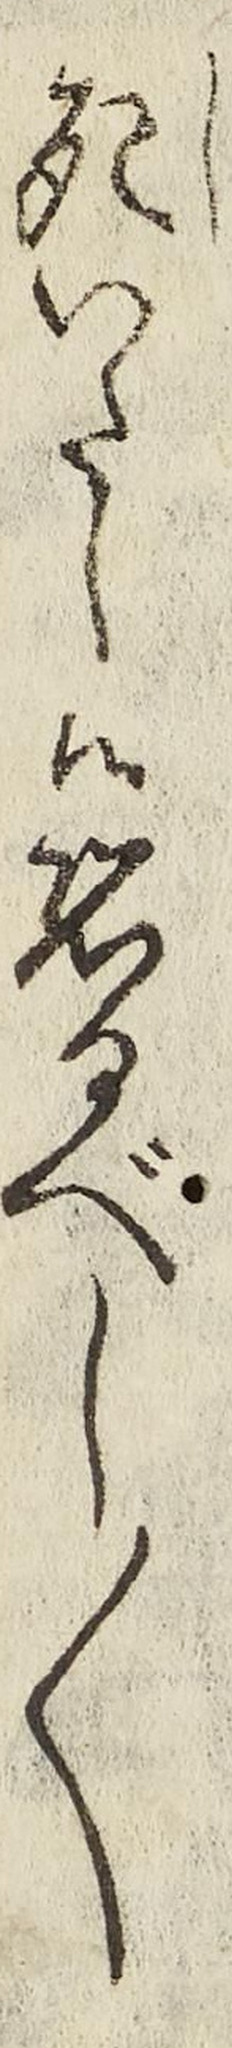死いたし候恐るべし〳〵

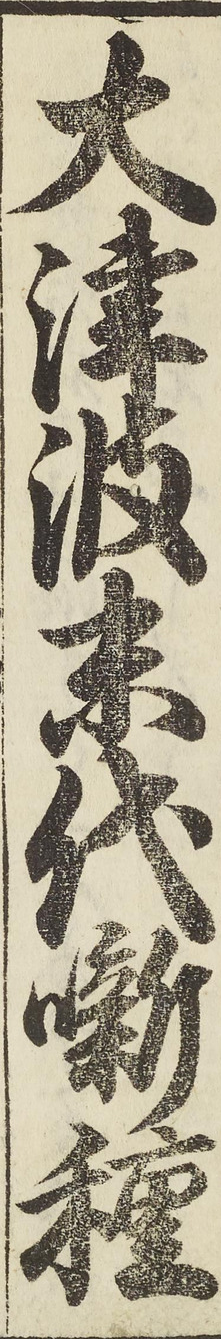大津浪末代噺種
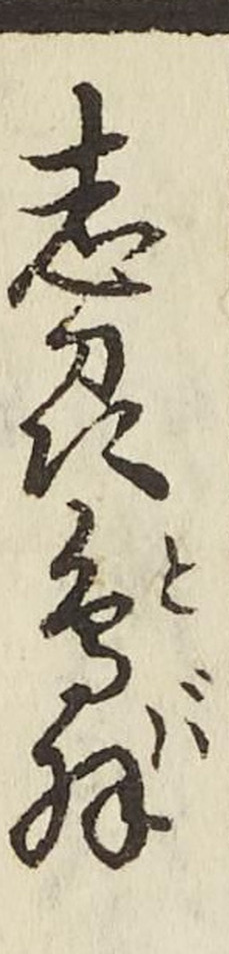志州鳥羽
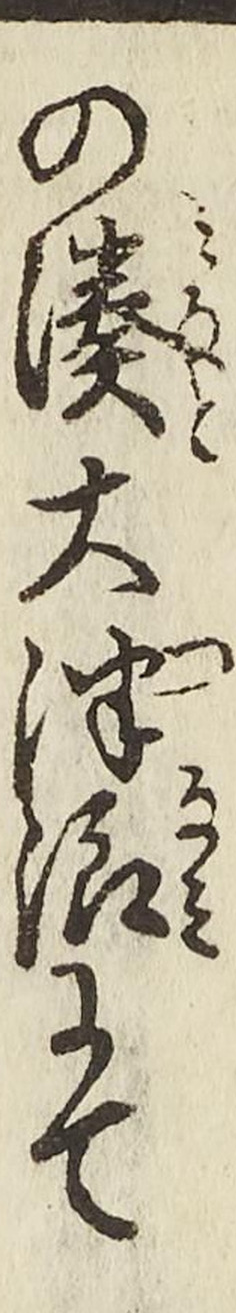の湊大津浪にて
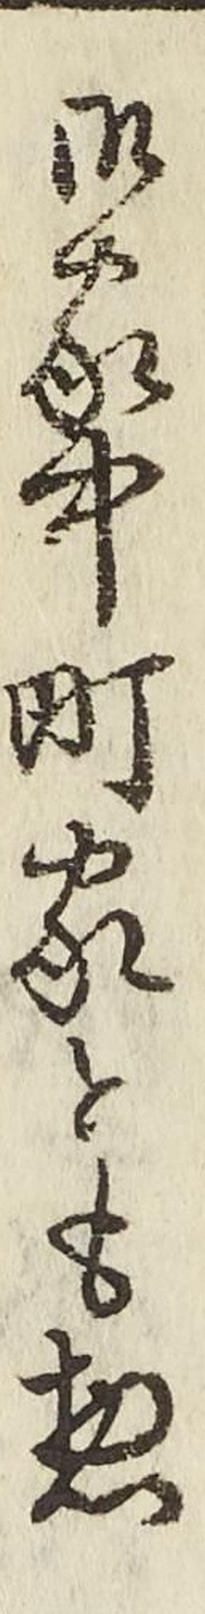御家中町家とも惣
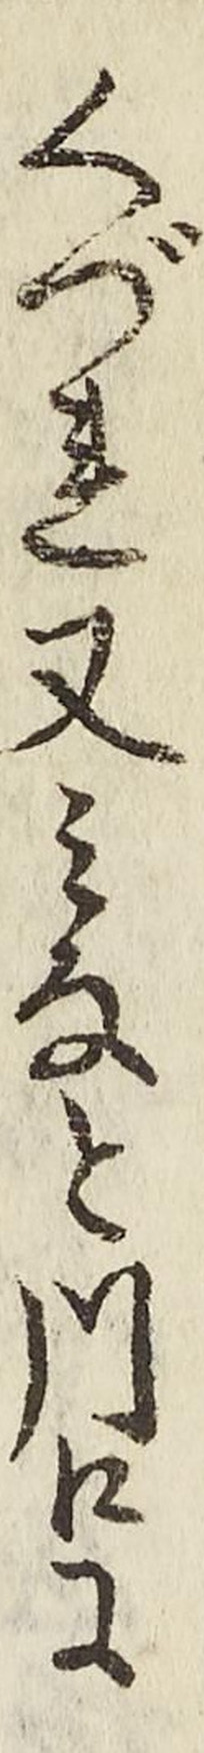くづれ又みなと川口に
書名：地震津浪末代噺の種　全
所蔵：東京大学地震研究所図書室 Earthquake Research Institute Library, The University of Tokyo, JAPAN
